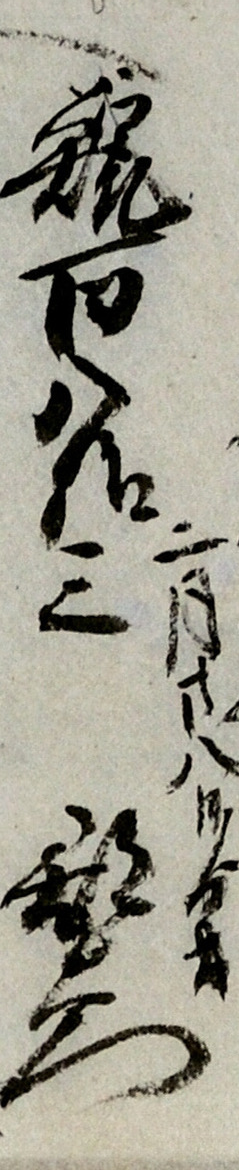鯇百八拾三郡右衛門
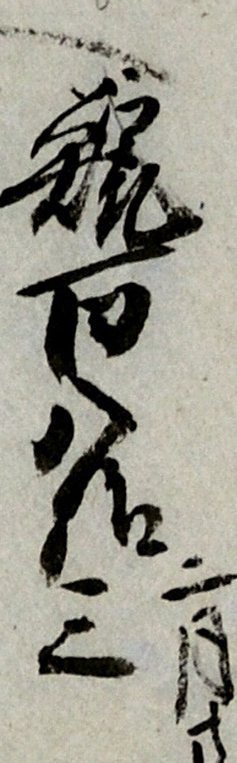千百三拾三
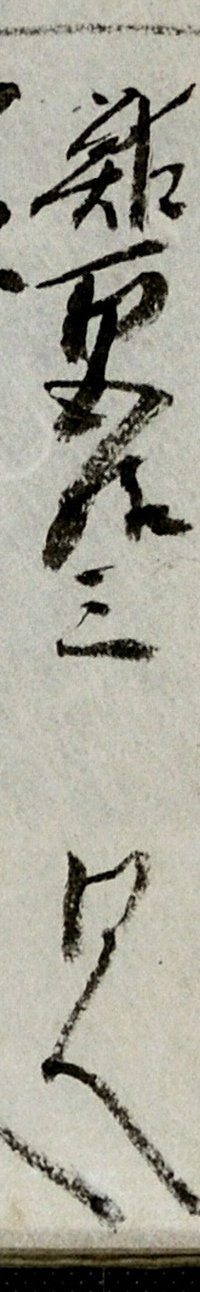鮎百五拾三同人
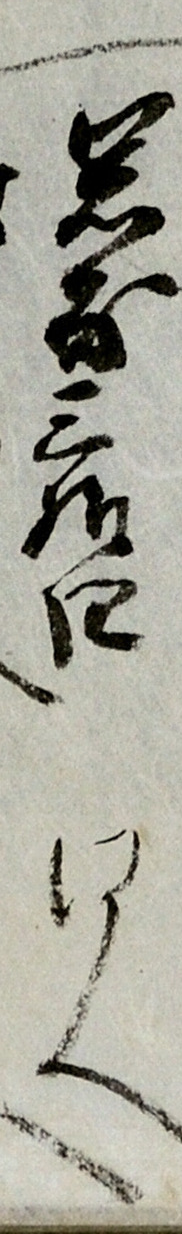岩な三拾四同人
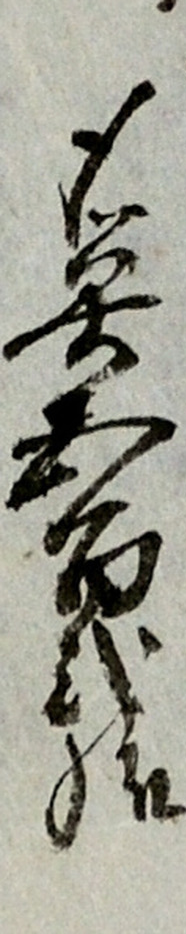〆魚五百弐拾
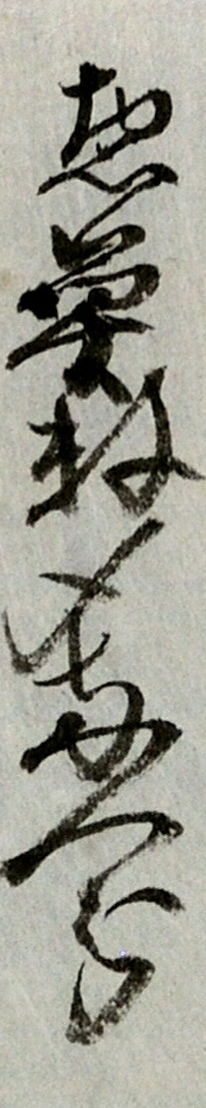惣魚数〆両人分
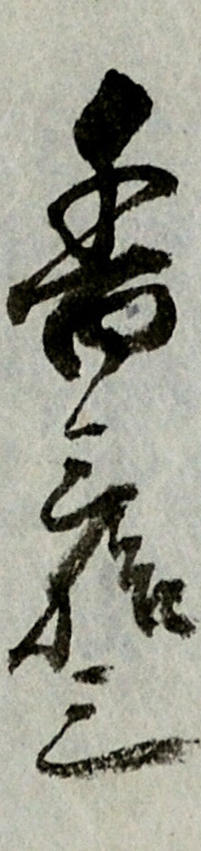千百三拾三
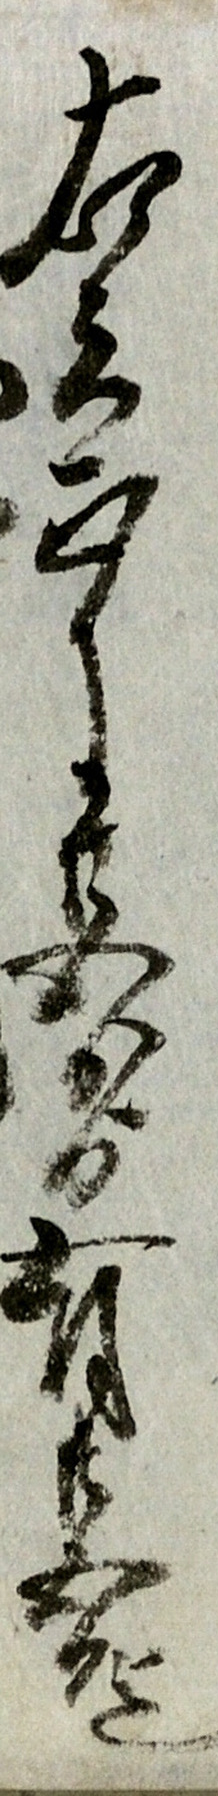右は正月廿五日ゟ五月廿五日迄
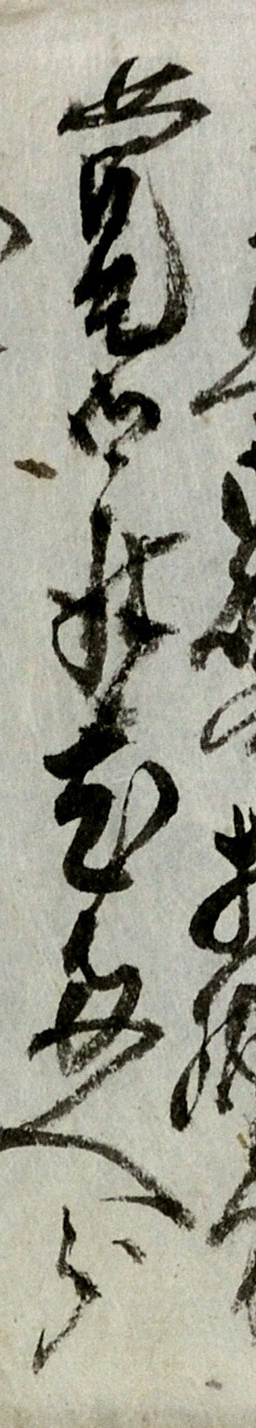如是御座候尤両人分
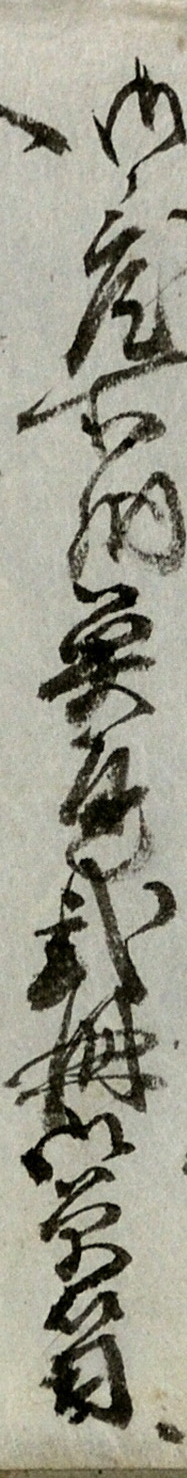御蔵所納魚通弐株御箪笥
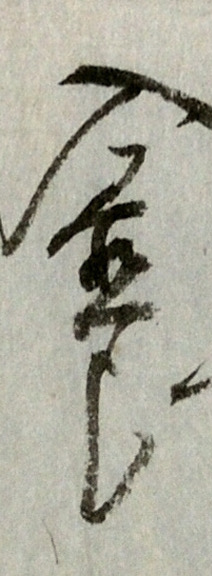入置申候
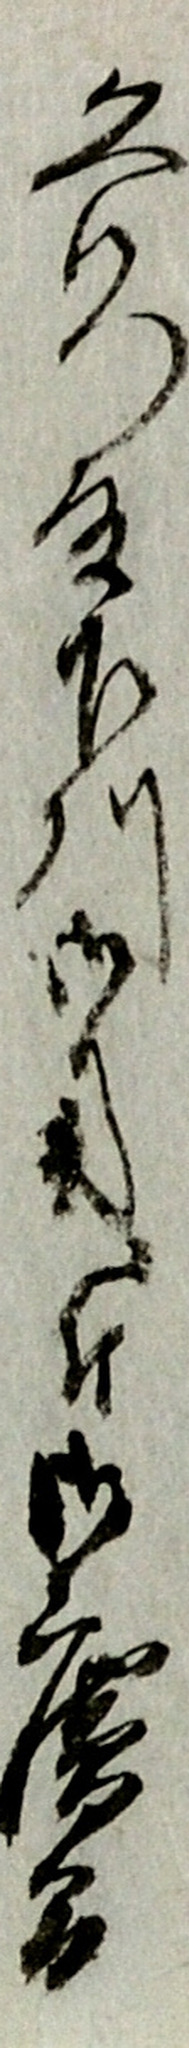久左衛門殿下川御用ニ付御広間
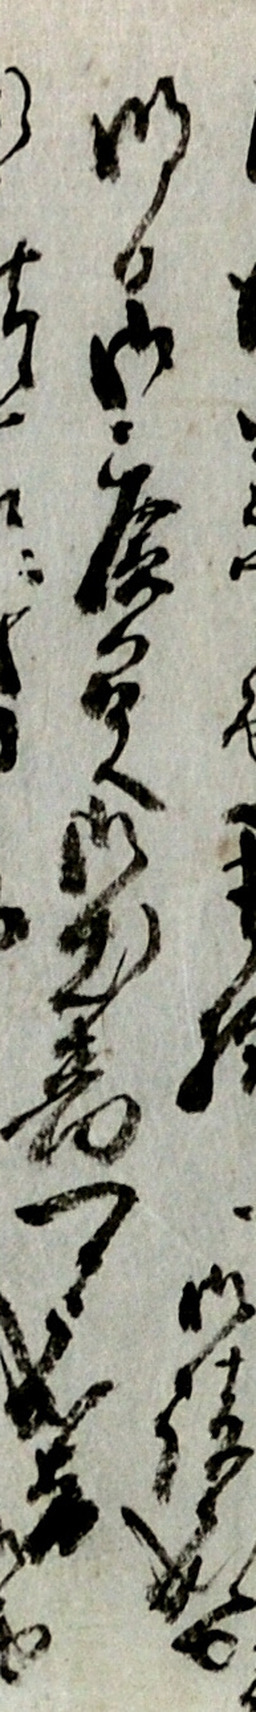明日御広間へ御出番可被成旨御届
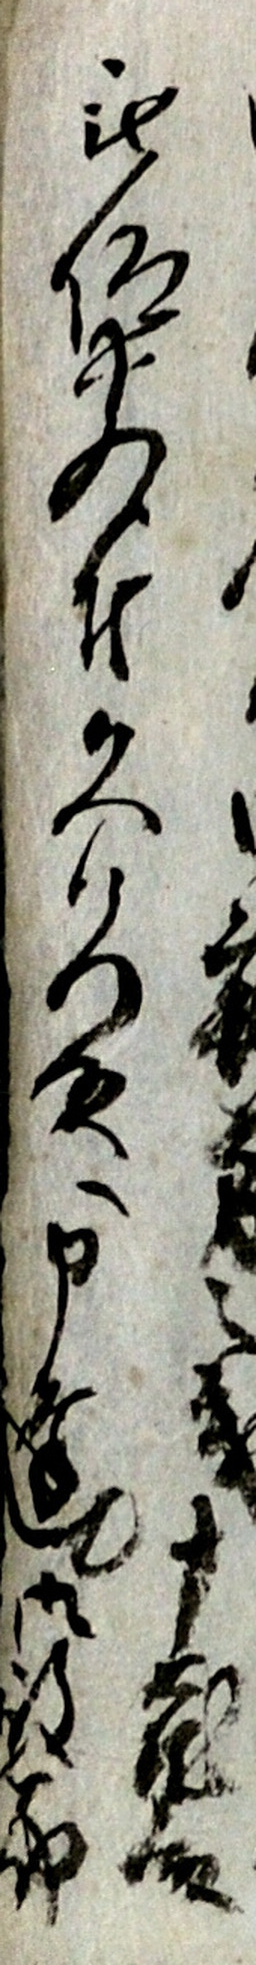被仰聞候付久左衛門殿へ申遺候御役届

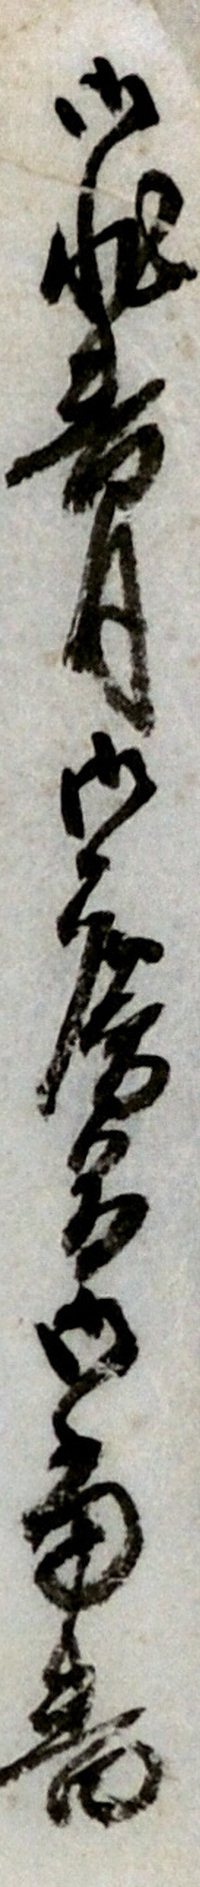御非番月御広間御当番
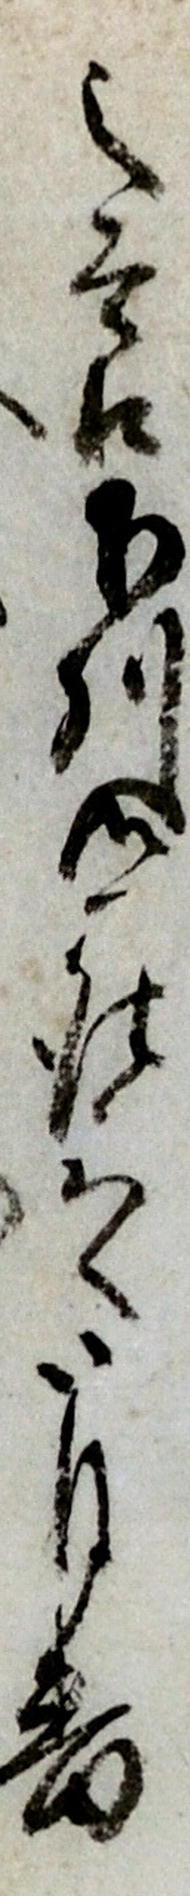之節下川御座候ハヽ御月番
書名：分一方諸事御用留帳
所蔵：伊那市立高遠町図書館・合同会社AMANE
